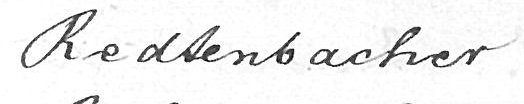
Redtenbacher
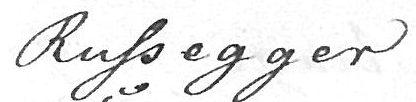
Russegger
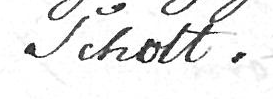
Schott
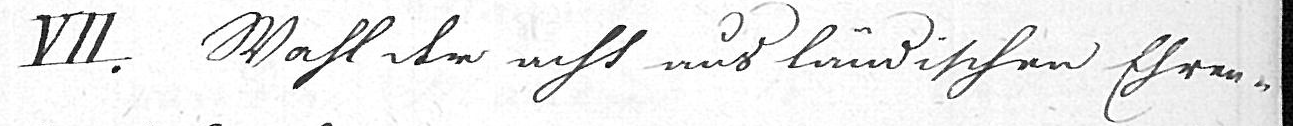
VII. Wahl der acht ausländischen Ehren-
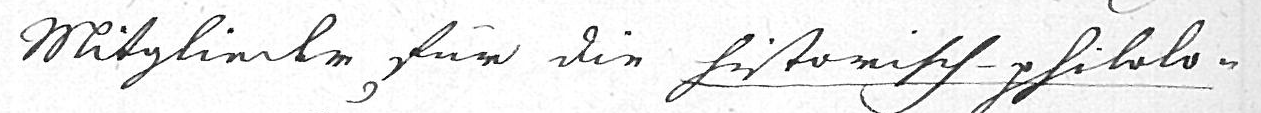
Mitglieder für die hstorisch-philolo-
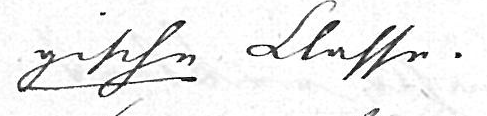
gische Classe.
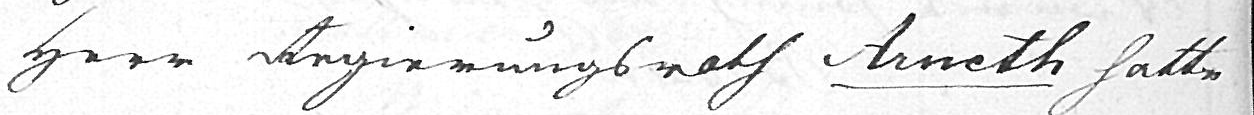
Herr Regierungsrath Arneth hatte
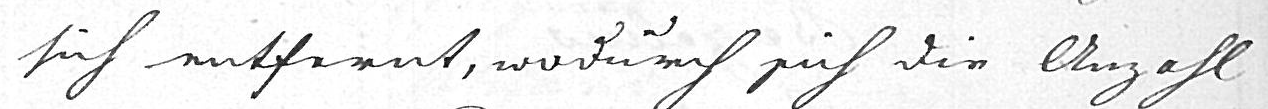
sich entfernt, wodurch sich die Anzahl
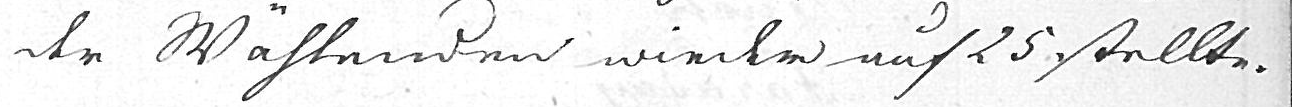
der Wählenden wieder auf 25 stellte.
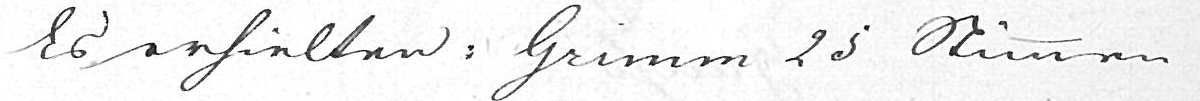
Es erhielten: Grimm 25 Stimmen
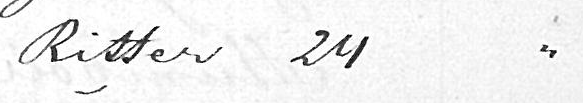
Ritter 24 "
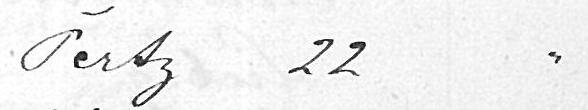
Pertz 22 "
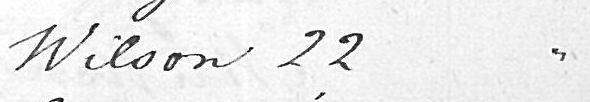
Wilson 22 "
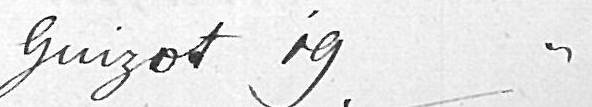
Guizot 19 "
